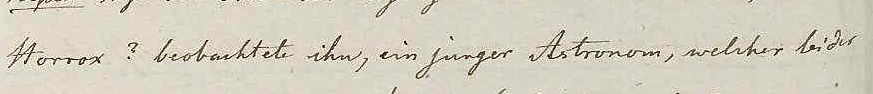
Horrox ? beobachtete ihn, ein junger Astronom, welcher leider
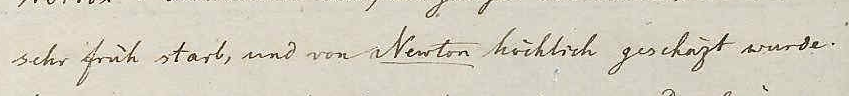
sehr früh starb, und von Newton höchlich geschäzt wurde.
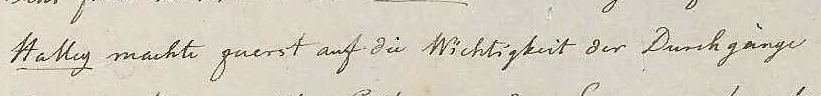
Halley machte zuerst auf die Wichtigkeit der Durchgänge
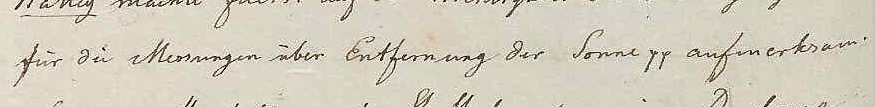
für die Messungen über Entfernung der Sonne pp aufmerksam.
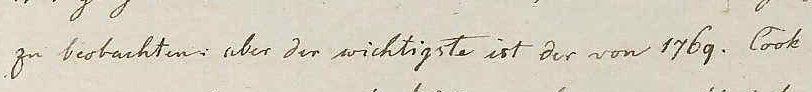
zu beobachten: aber der wichtigste ist der von 1769. Cook
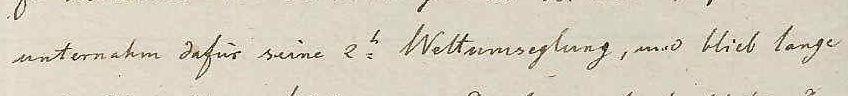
unternahm dafür seine 2t￼ Weltumseglung, und blieb lange
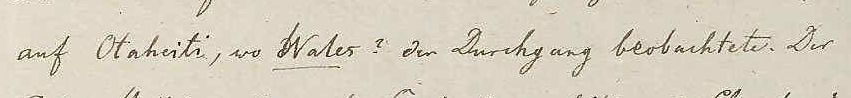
auf Otaheiti, wo dWales ? den Durchgang beobachtete. Der
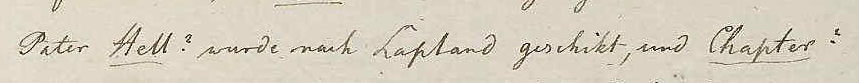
Pater Hell ? wurde nach Lapland geschikt, und Chapter ?
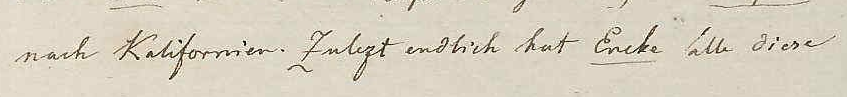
nach Kalifornien. Zulezt endlich hat Encke alle diese
